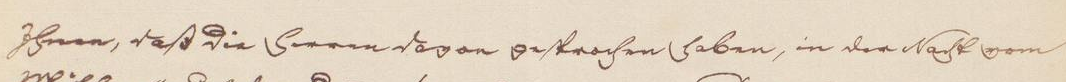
Ihnen, daß die Herren davon gesprochen haben, in der Nacht vom
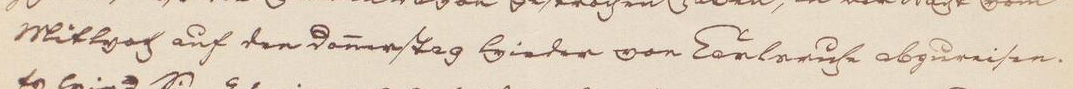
Mitwoch auf den Donnerstag wieder von Carlsruhe abzureisen.
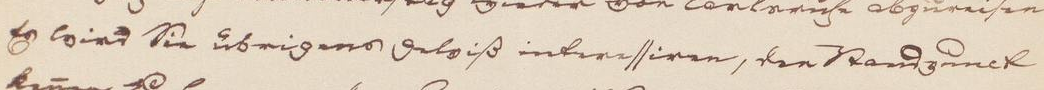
Es wird Sie übrigens gewiß interessiren, den Standpunct
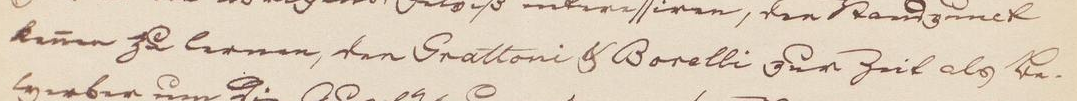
kennen zu lernen, den Grattoni & Borelli zur Zeit als Be-
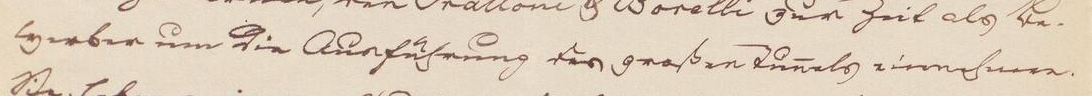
werber um die Ausführung des großen Tunnels einnehmen.
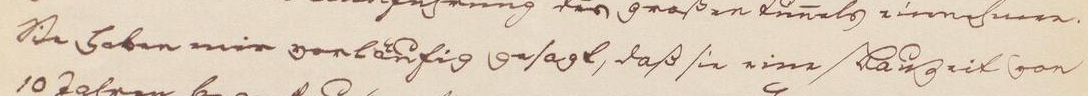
Sie haben mir vorläufig gesagt, daß sie eine Bauzeit von
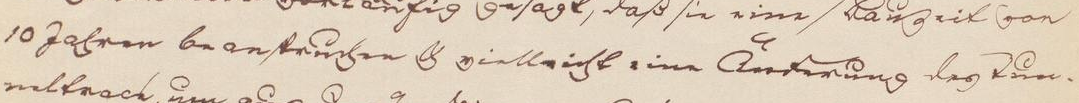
10 Jahren beanspruchen & vielleicht eine Änderung des Tun-
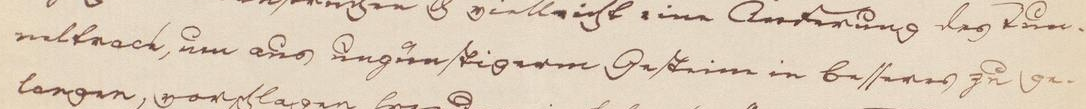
neltracé, um aus ungünstigerm Gesteine in besseres zu ge-
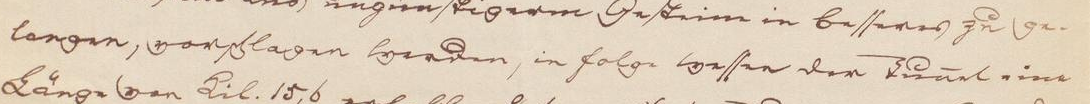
langen, vorschlagen werden, in Folge wessen der Tunnel eine
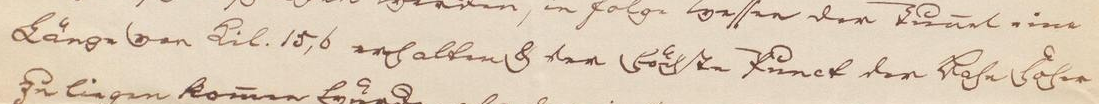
Länge von Kil. 15,6 erhalten & der höchste Punct der Bahn höher
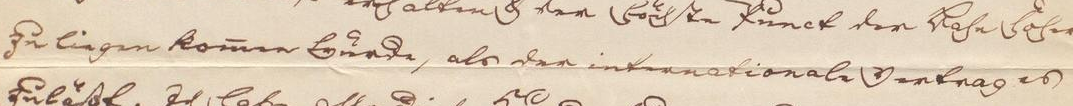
zu liegen kommen würde, als der internationale Vertrag es
